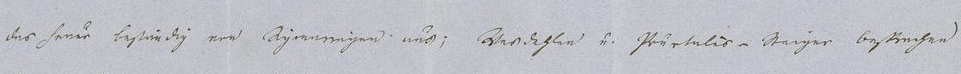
das Feuer beständig von Sigmaringen aus; Vasdehlen u. Pourtalès-Steiger besprachen
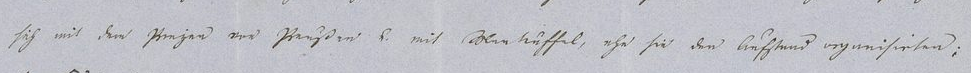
sich mit dem Prinzen v. Preußen u. mit Manteuffel, ehe sie den Aufstand organisirten;
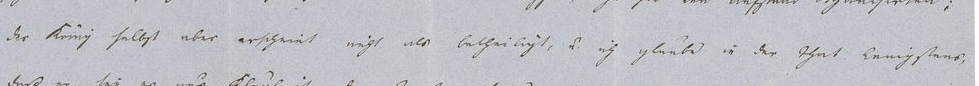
der König selbst aber erscheint nicht als betheiligt, u. ich glaube in der That wenigstens,
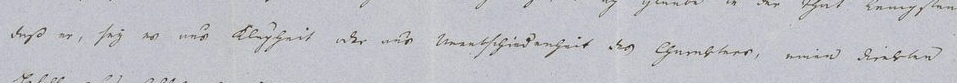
daß er, sey es aus Klugheit oder aus Unentschiedenheit des Charakters, einen direkten
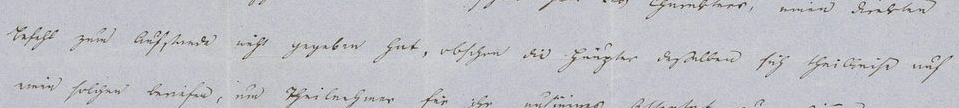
Befehl zum Aufstande nicht gegeben hat, obschon die Häupter desselben sich theilweise auf
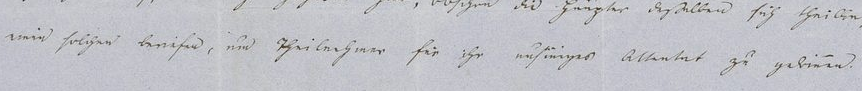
einen solchen beriefen, um Theilnehmer für ihr unsinniges Attentat zu gewinnen.
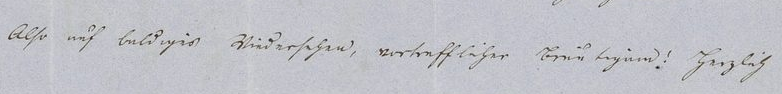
Also auf baldiges Wiedersehen, vortrefflicher Bräutigam! Herzlich
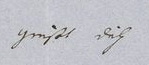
grüßt Dich
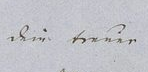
Dein treuer
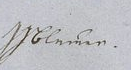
J J Blumer.
